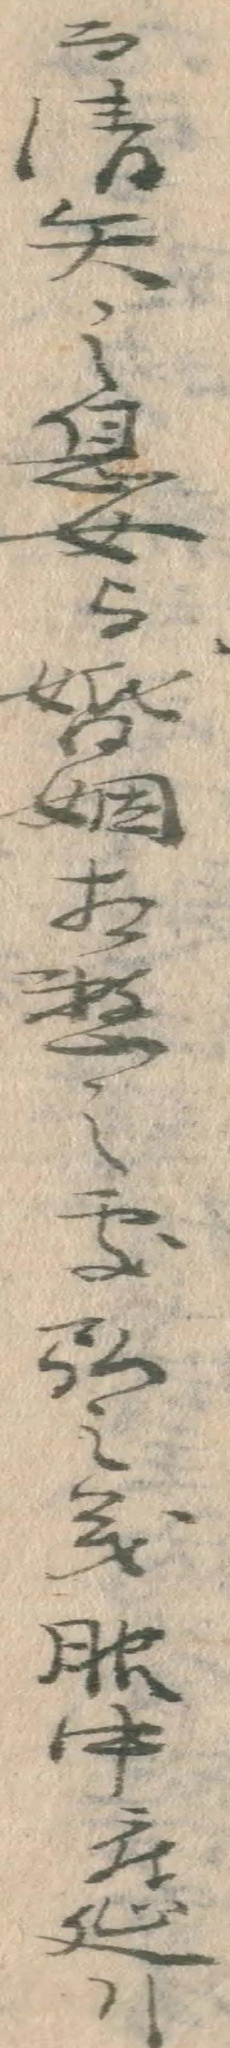而清矢之息女と婚姻相整之處弘之義服中ニ付延引
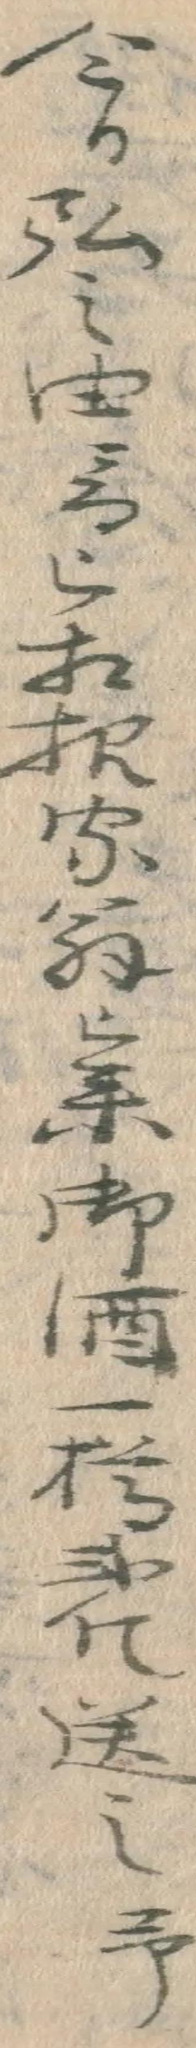今日弘之由ニ而被相招家翁被参御酒一樽弐升送之予
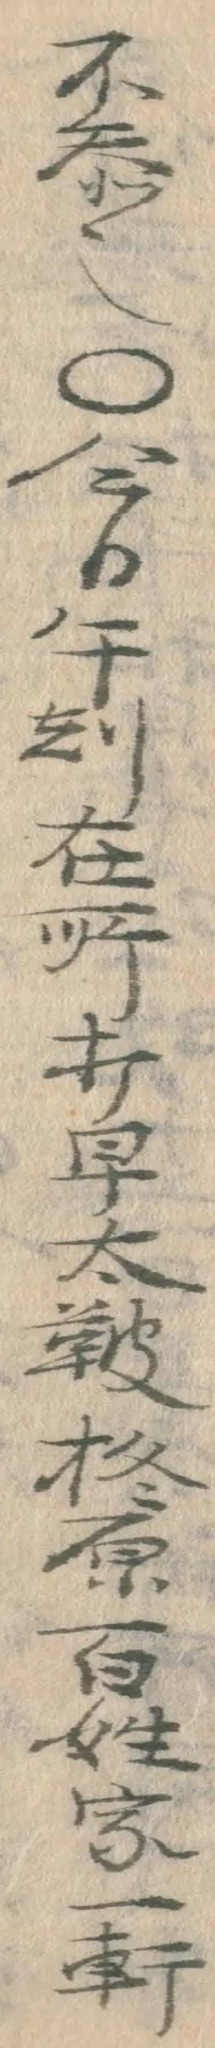不参也○今日午刻在所打早太鼓柊原百姓家一軒
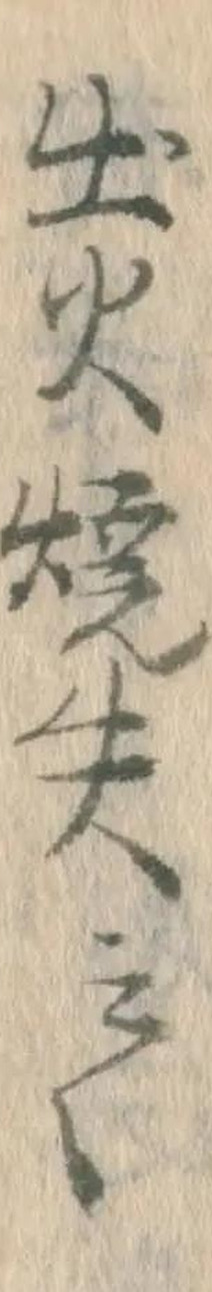出火焼失云〻
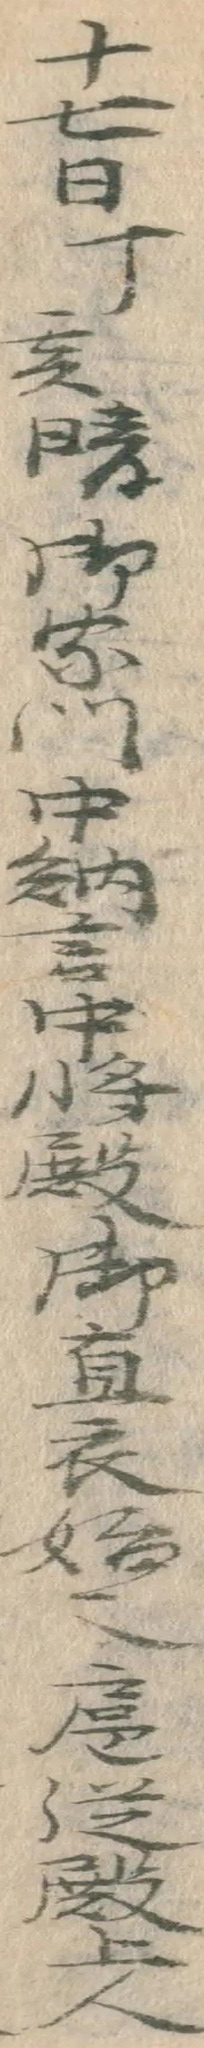十七日丁亥晴御家門中納言中将殿御直衣始也扈従殿上人
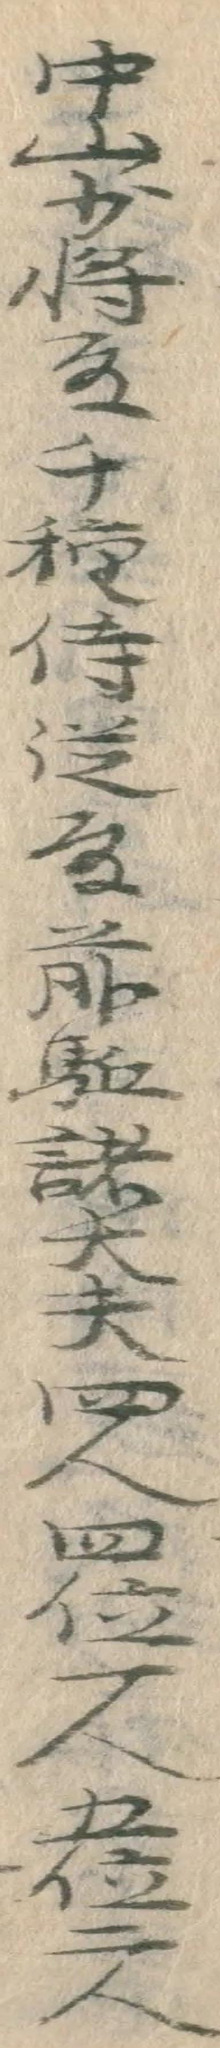中山少将殿千種侍従殿前駈諸大夫四人四位一人五位二人
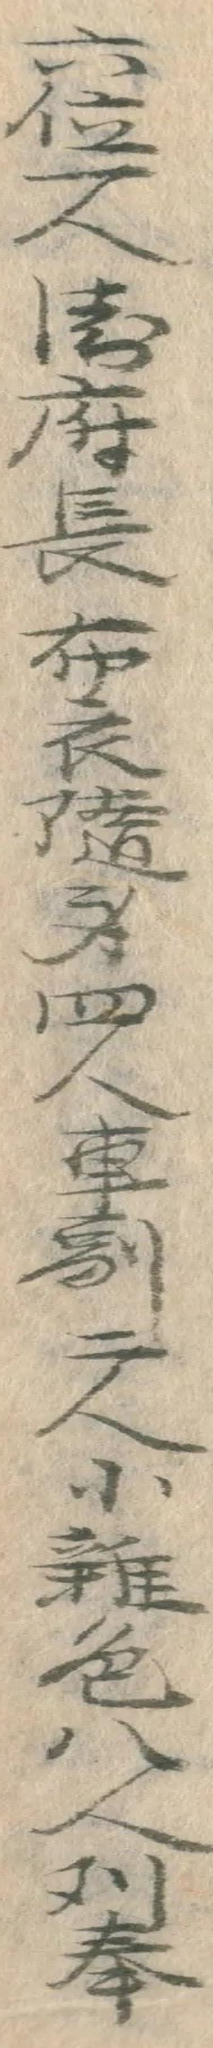六位一人清府長布衣随身四人車副二人小雑色八人列奉

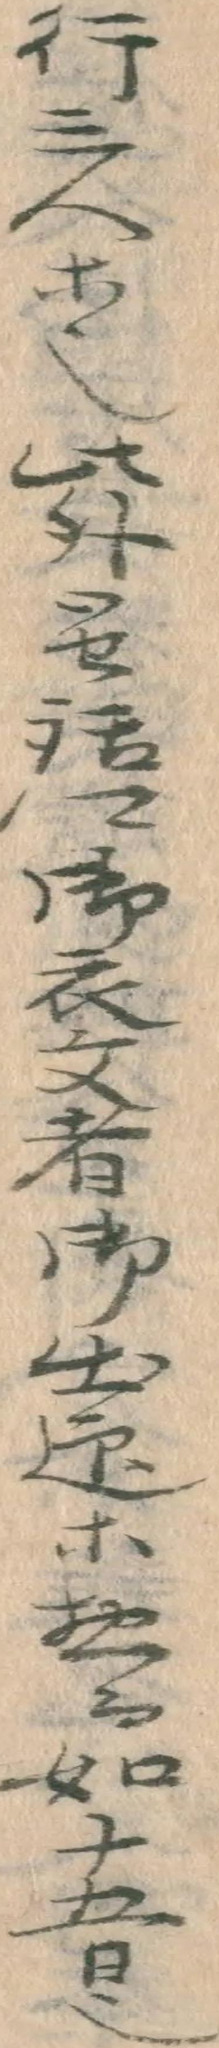行三人等也此外御セ話卿御衣文者御出迎等惣而如十五日也
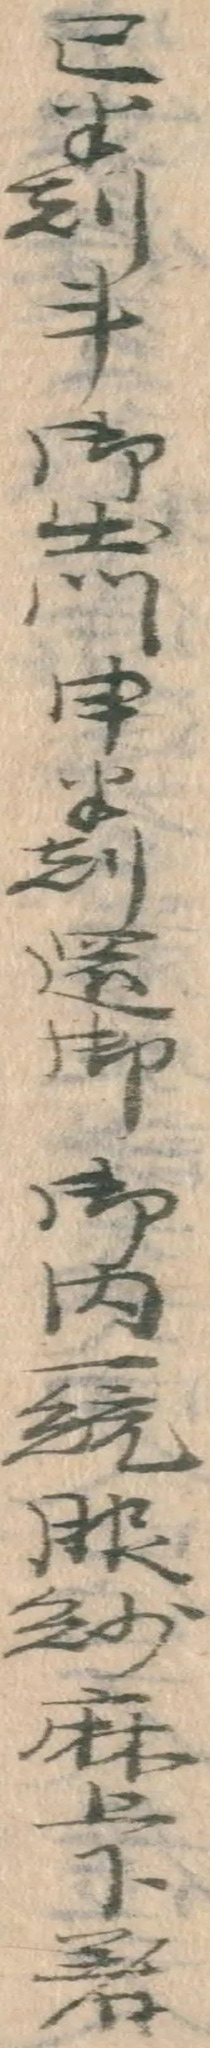巳半刻斗御出門申半刻還御内一統服紗麻上下着
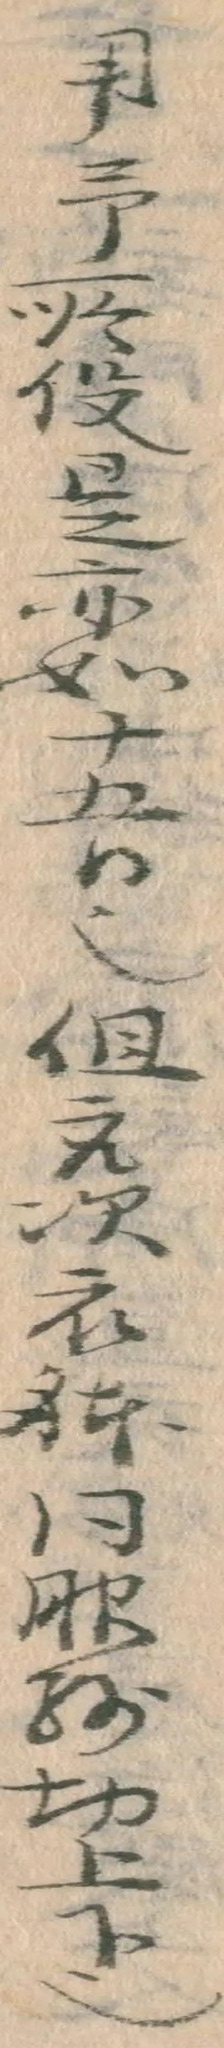用予所役是亦如十五日也但取次衣躰同服残切上下也
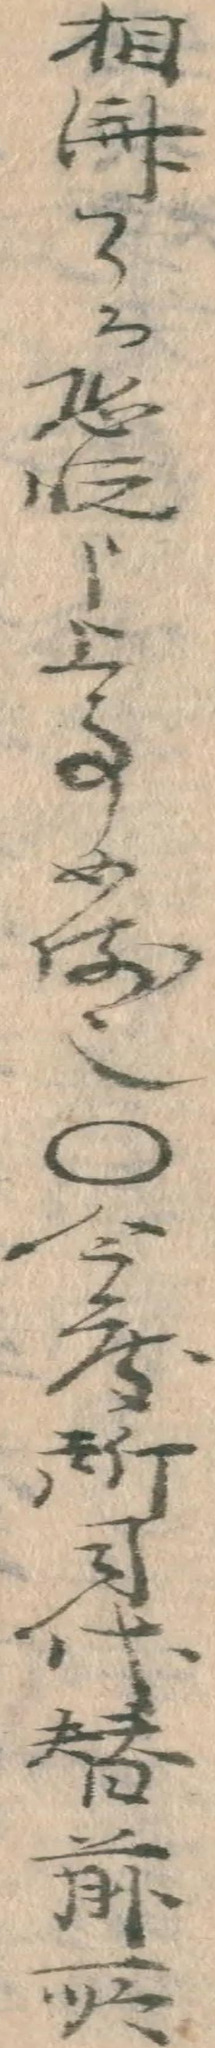相済了而恐悦申上事如例也○今度所司代替前所
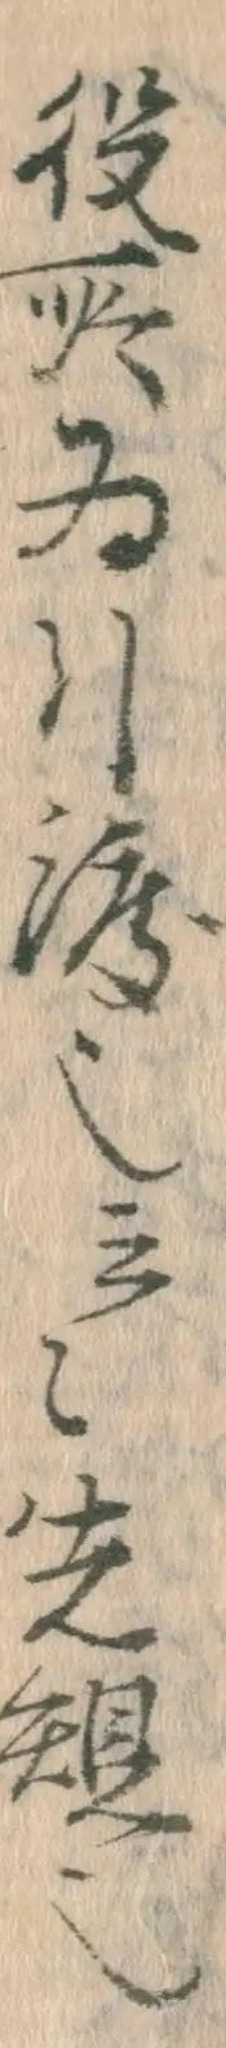役所為引渡也云々先規也
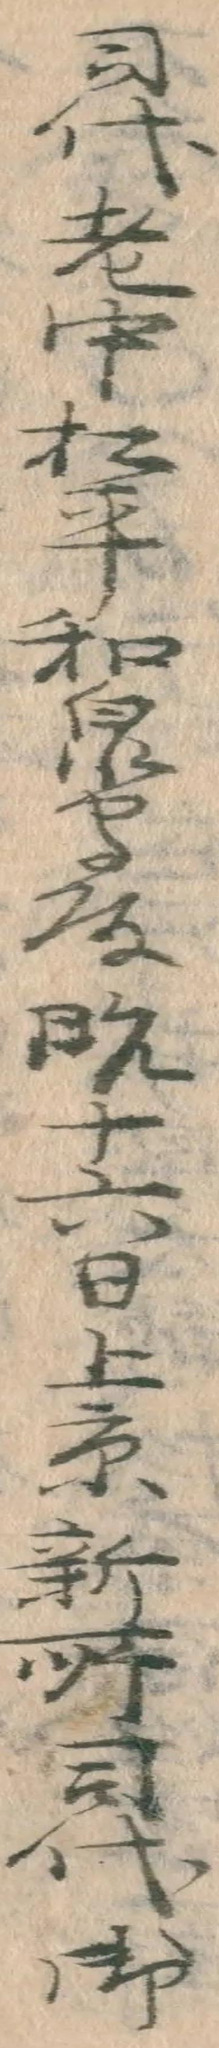司代老中松平和泉守殿昨十六日上京新所司代御
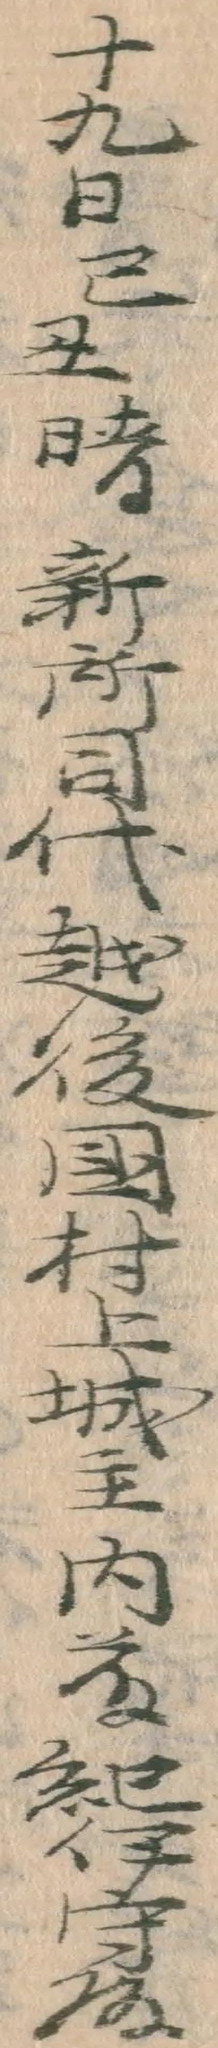十九日己丑晴新所司代越後國村上城主内藤紀伊守殿
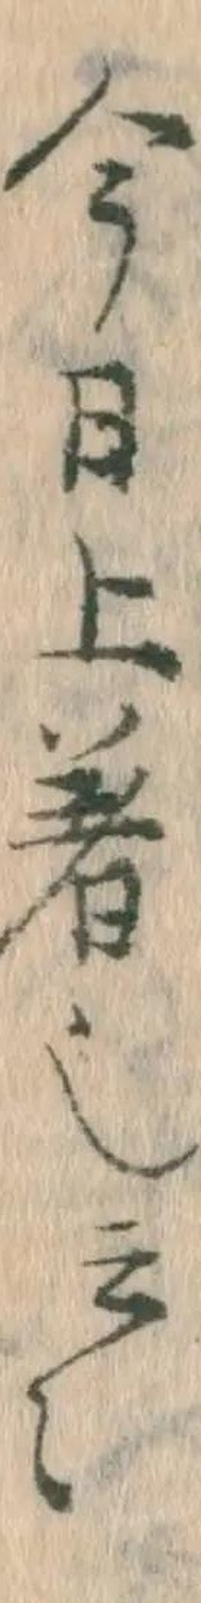今日上着也云々
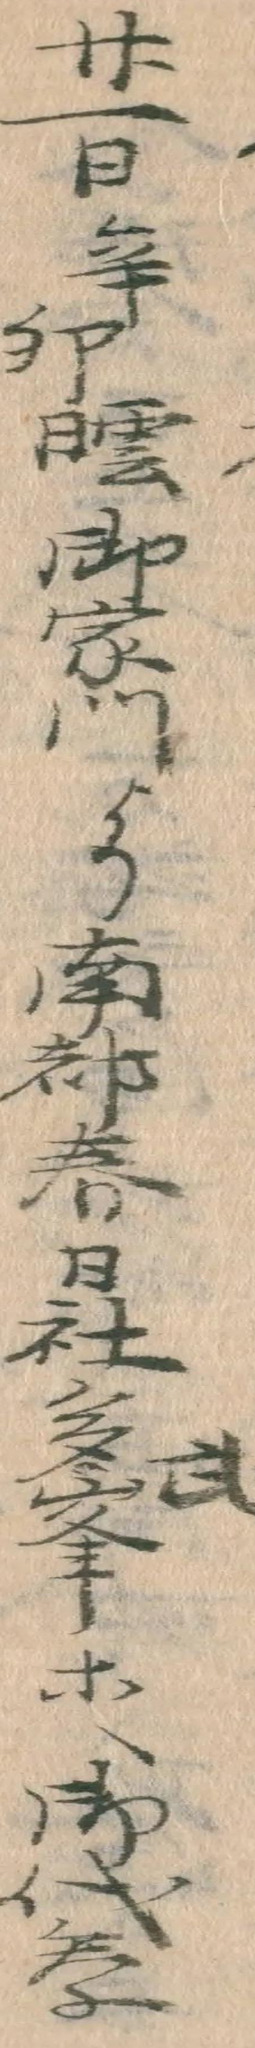廿一日辛卯曇御家門より南都春日社多峯等へ御代参
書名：賀茂社記録. 第63冊
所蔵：国立国会図書館 National Diet Library, JAPAN
